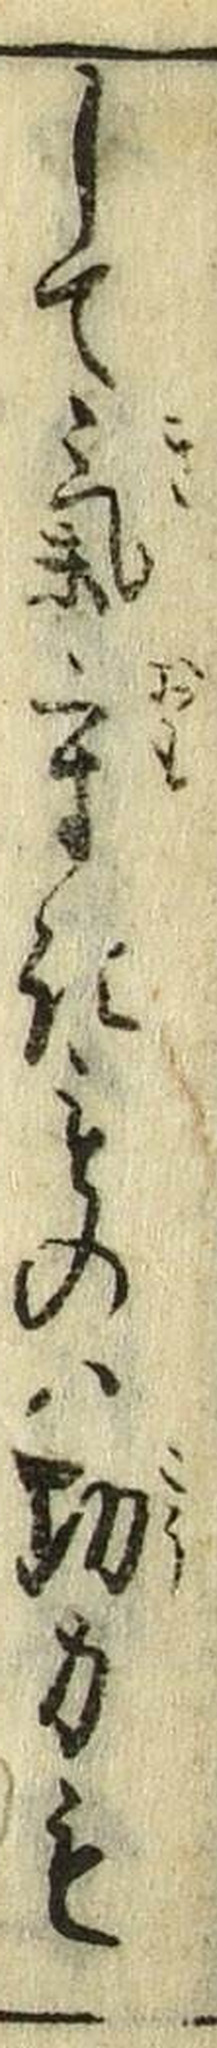して気重きものは功力も
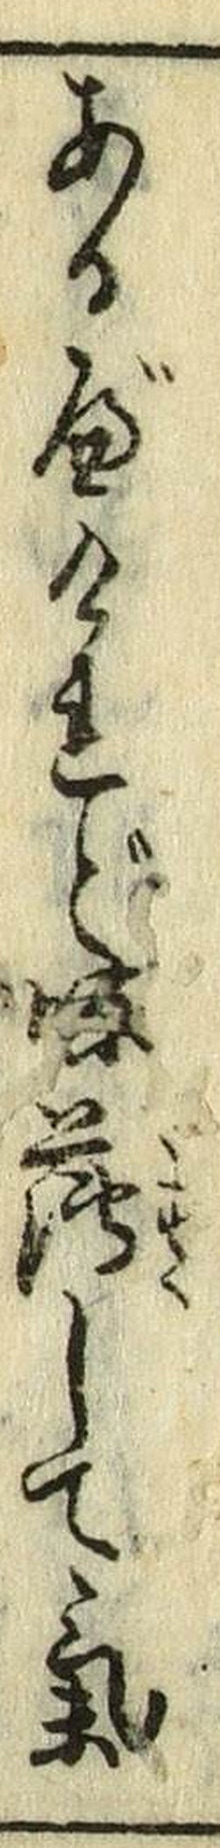あるべけれど味薄して気
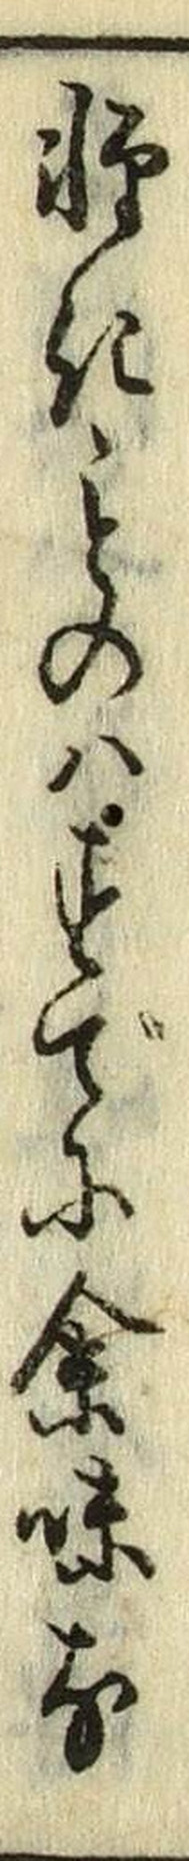軽きものはすでに余味な
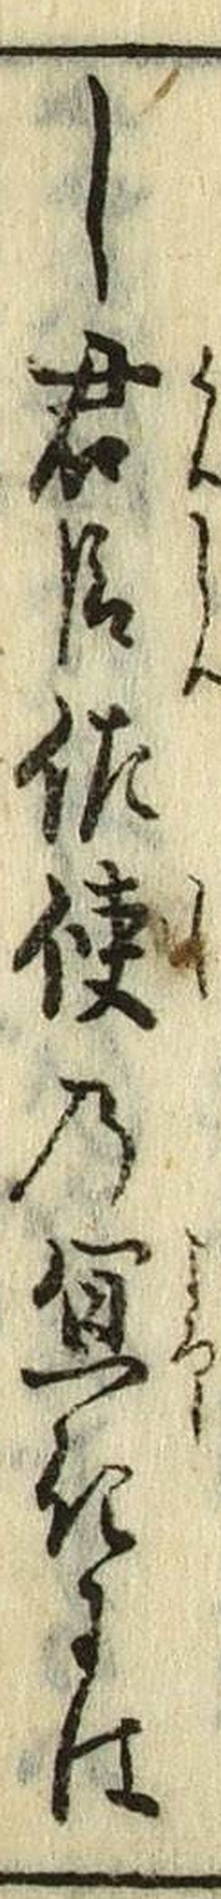し君臣左使の宜きには
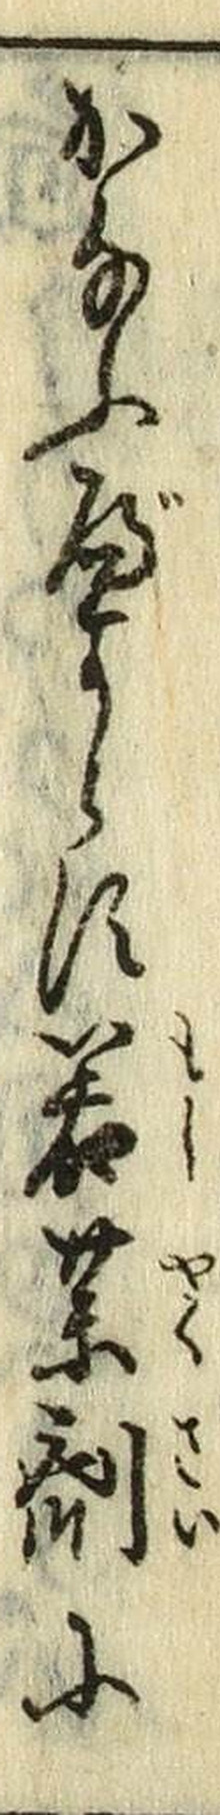かなふべからす若薬剤に
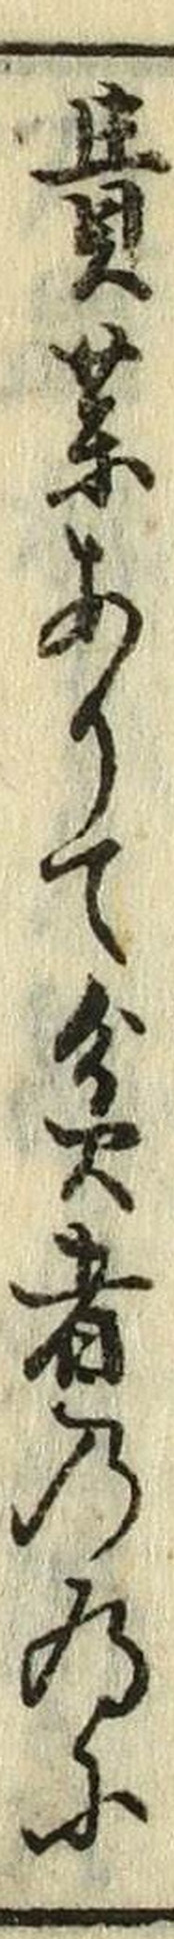貴薬ありて貧者の為に
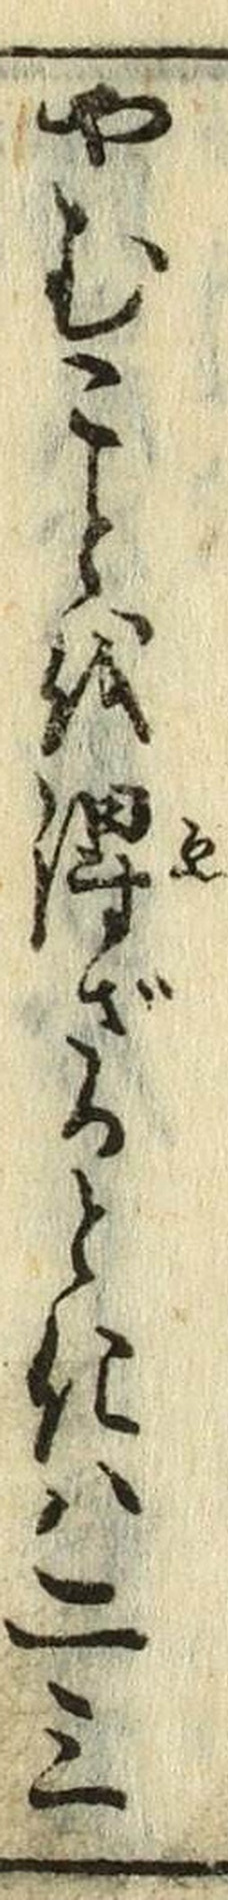やむことを得ざるときは二三
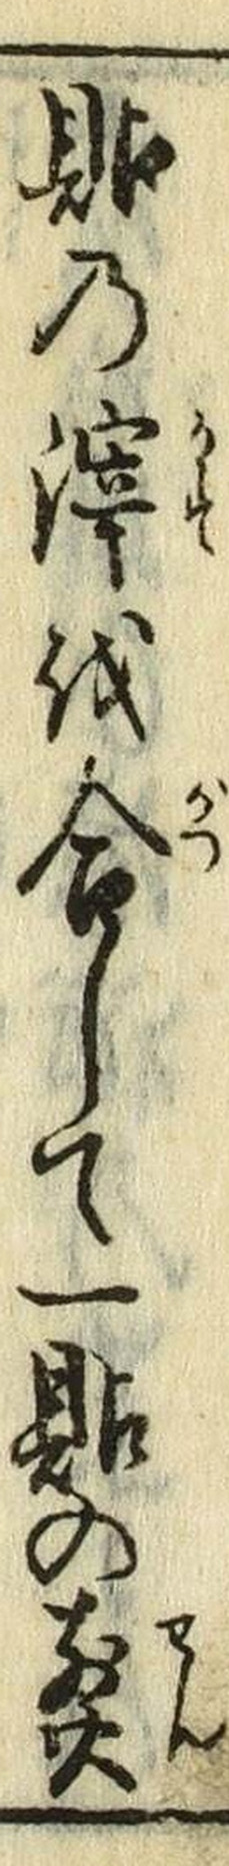貼の滓を合して一貼の煎
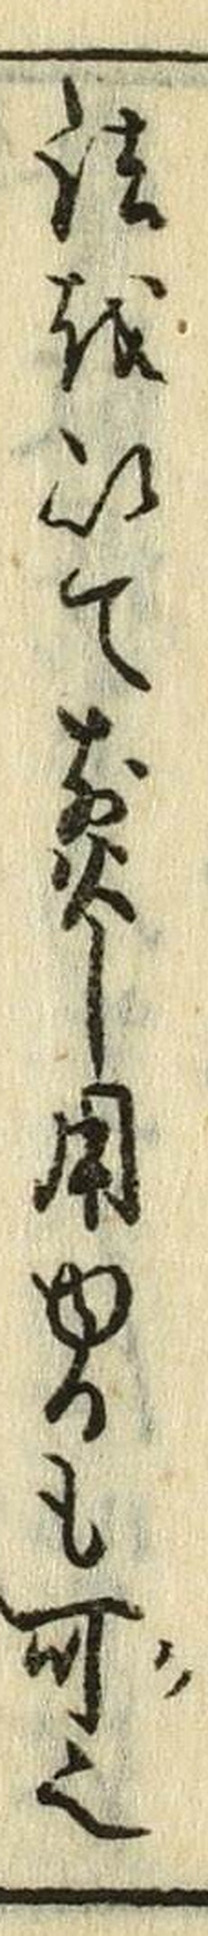法を以て煎し用ゆるも可也
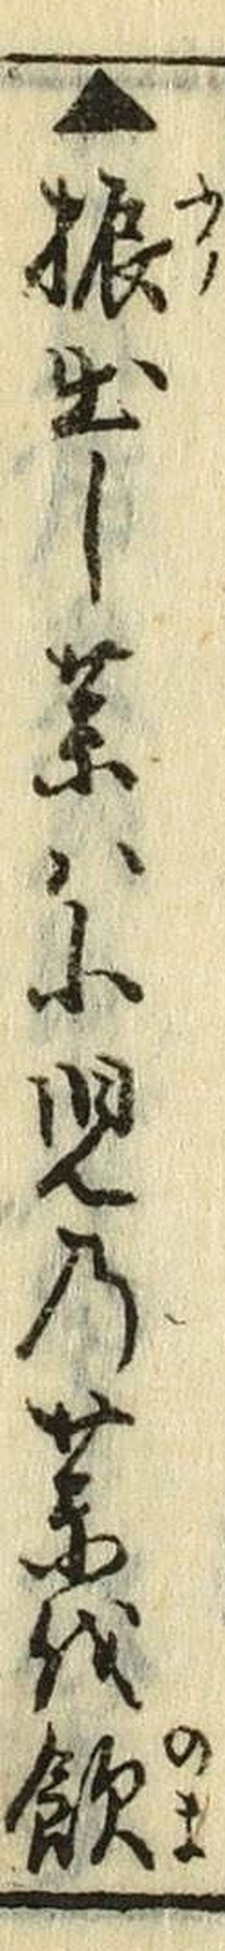▲振出し薬は小児の薬を飲
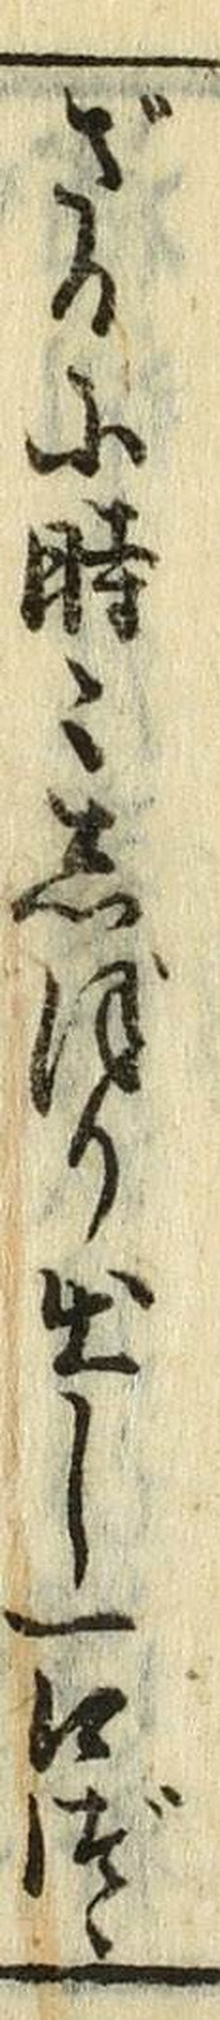ざるに時々しぼり出し一口づゝ
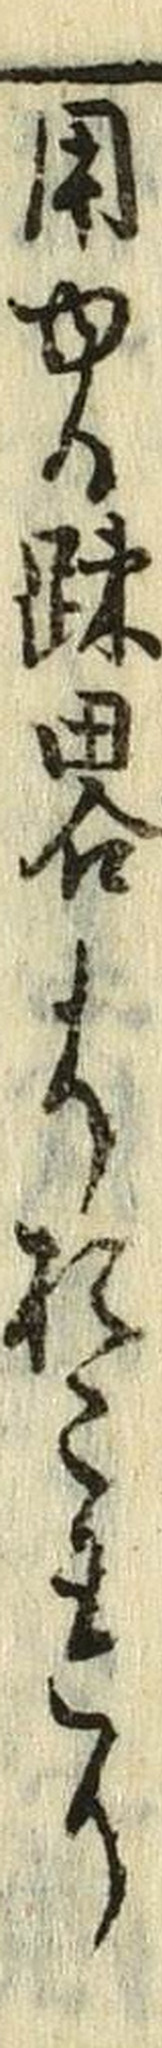用ゆる疎略よりおこれり
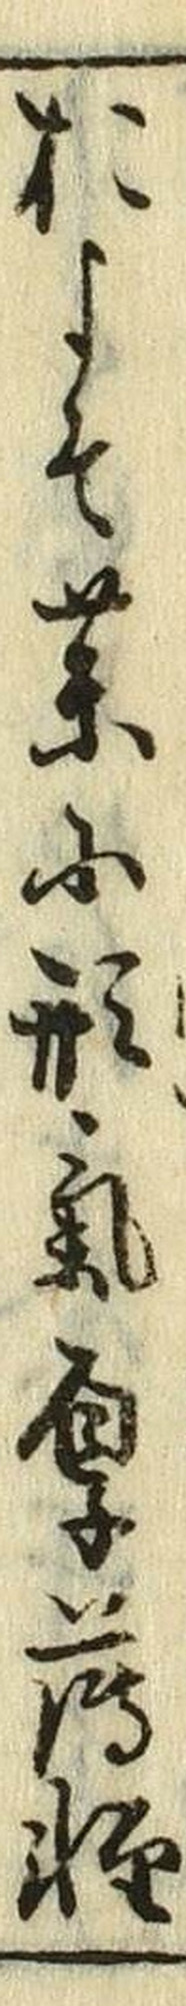およそ薬に形気厚薄軽
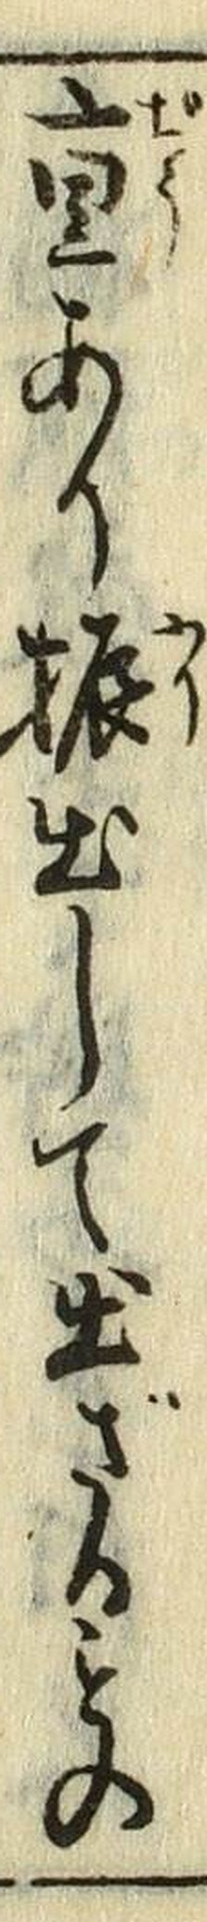重あり振出して出ざるもの
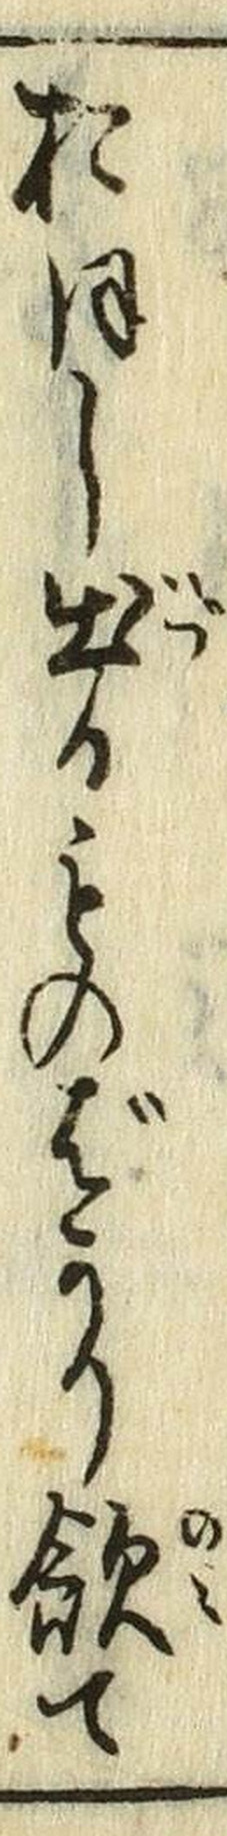おほし出るものばかり飲て
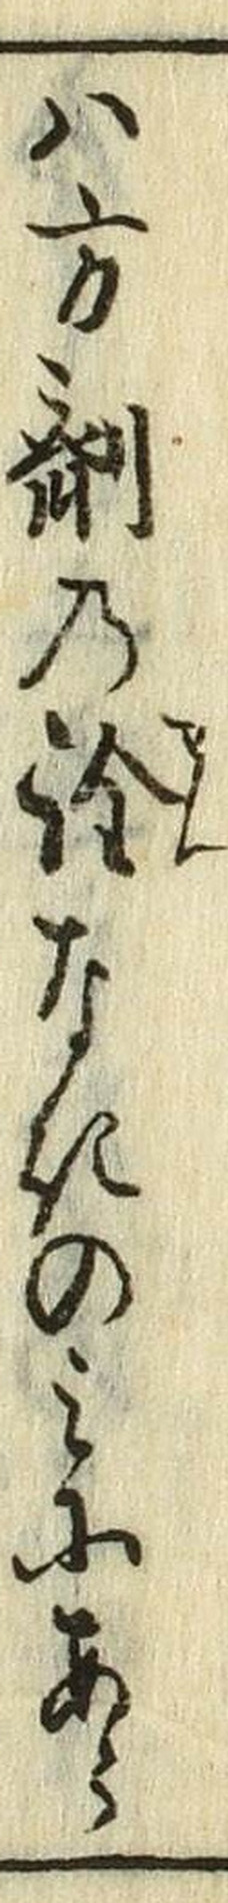は方剤の詮なきのみにあら
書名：居家養生記
